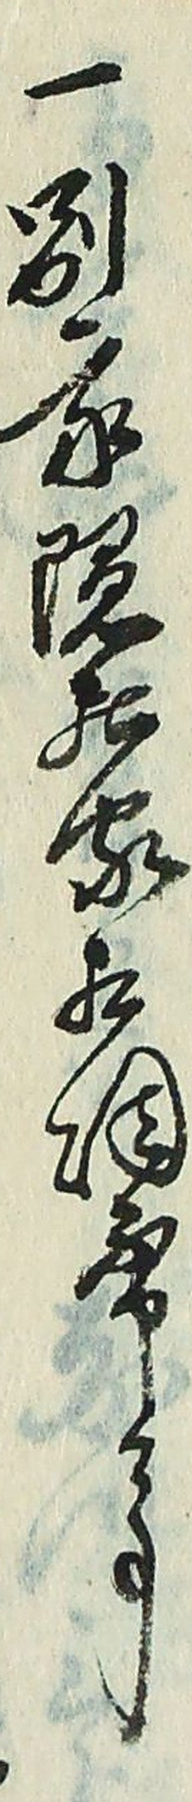一別家隠居家相調不申候事
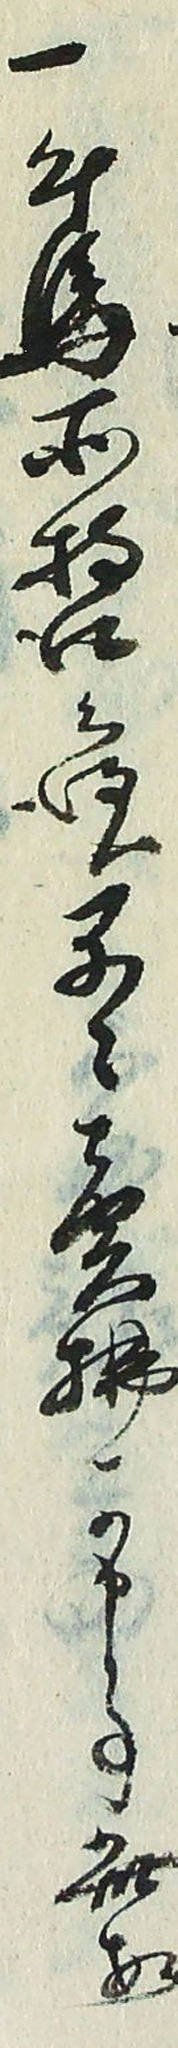一牛馬所持仕候得ハ早々賣拂可申事此数
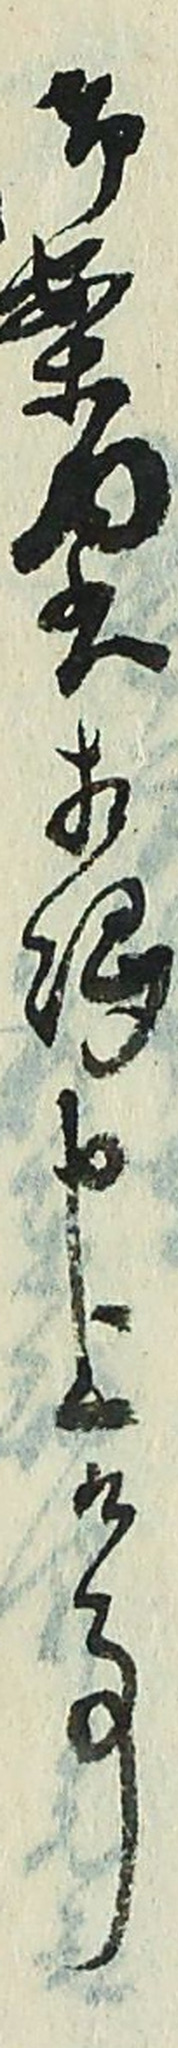御案内書相認メ申上候事
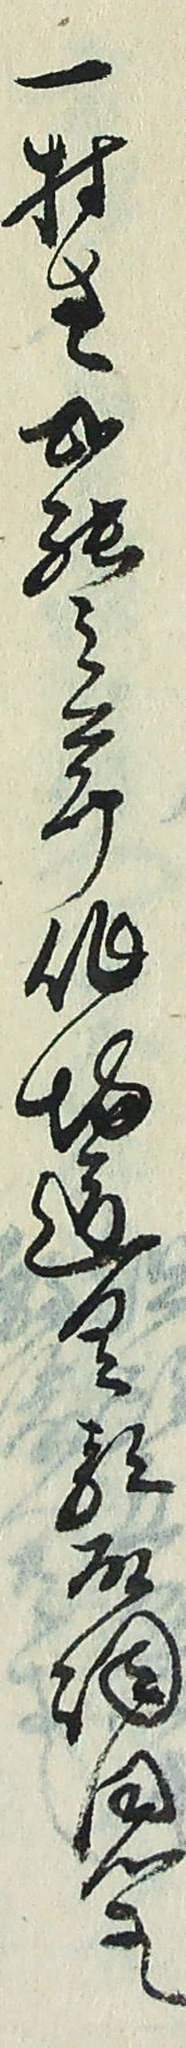一村方へ出張之節作場道具類取調同心方へ
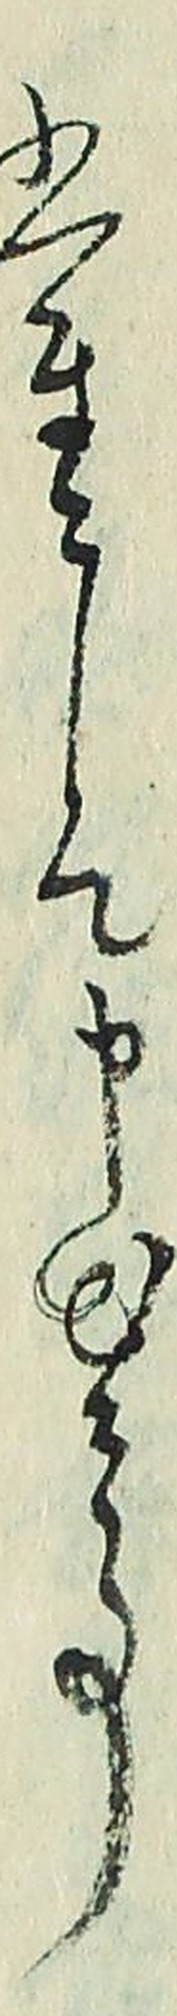書付ニして申出候事
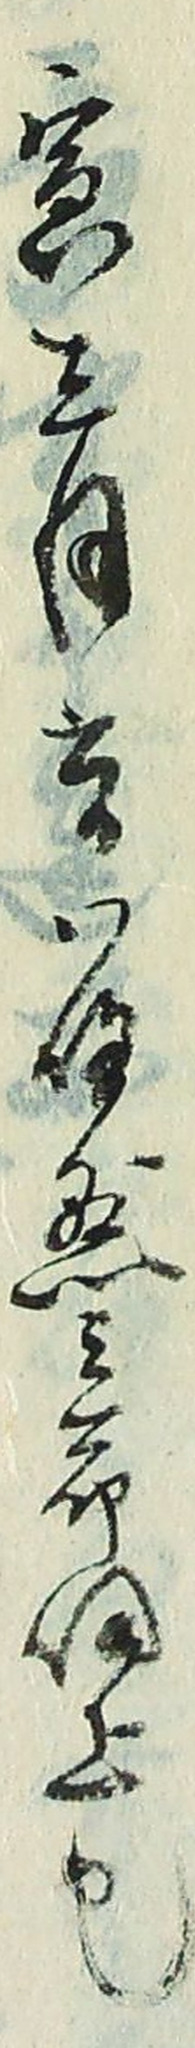寅十二月六日御呼懸之節伺上申候
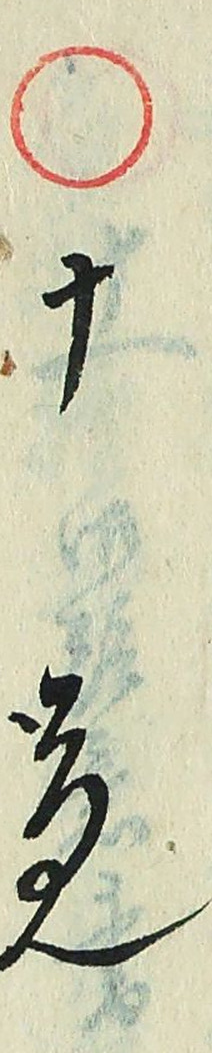○十覚
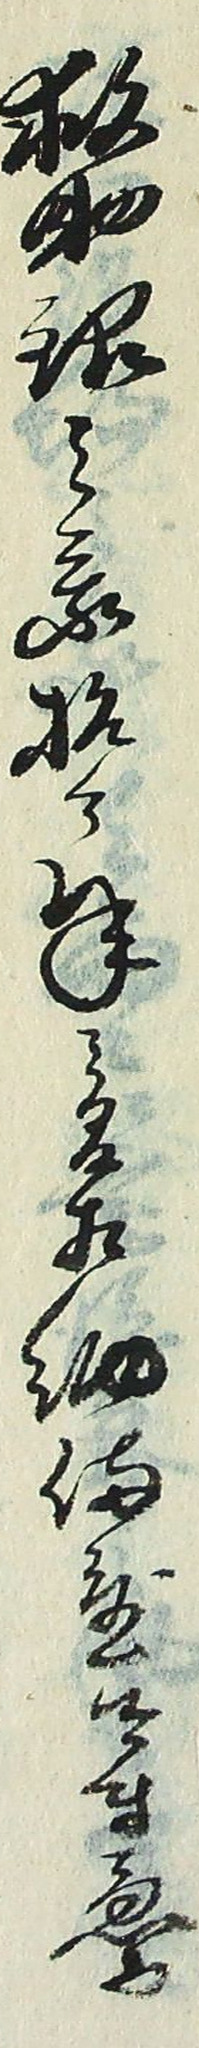救助銀之義拾ケ年之間相納備置候ニ付兼而
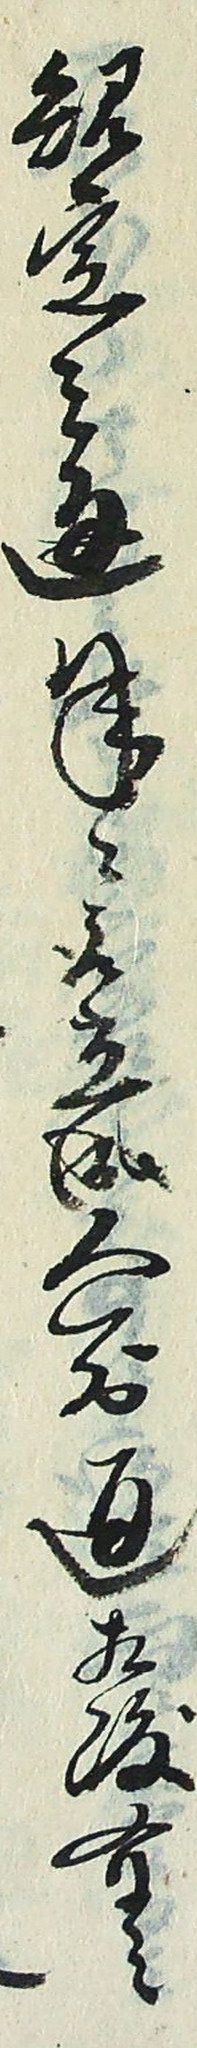規定之通年々取立成人別通相渡有之
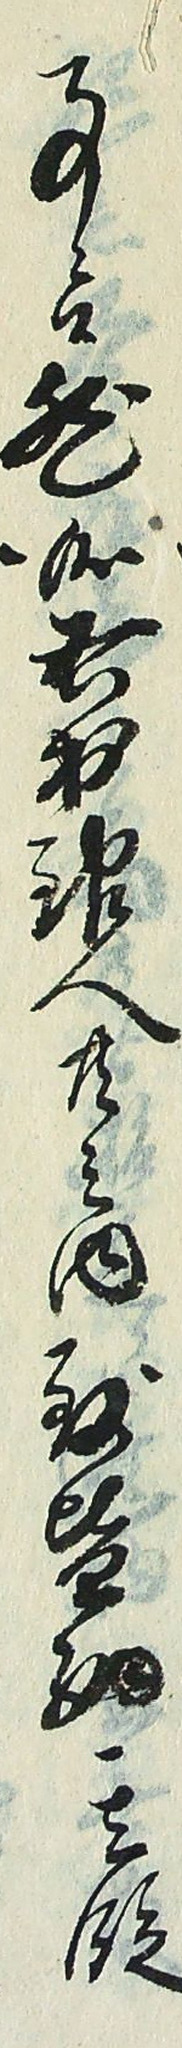事ニ候然所右出銀人共之内致皆納其段
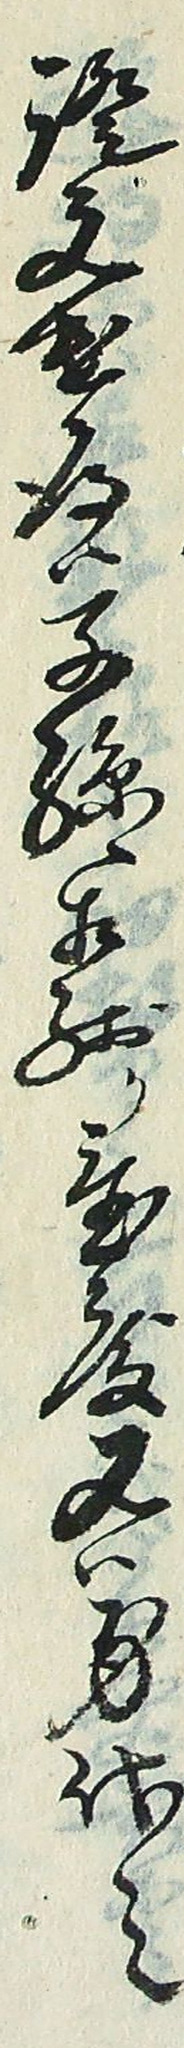證文遣候得ハ子孫へ相残り置度又ハ身代之
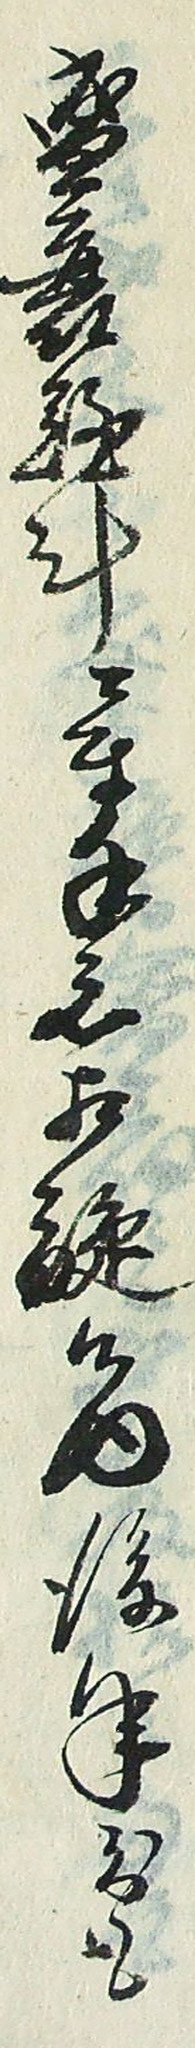盛衰難計ニ付手元相旋候内後年分も

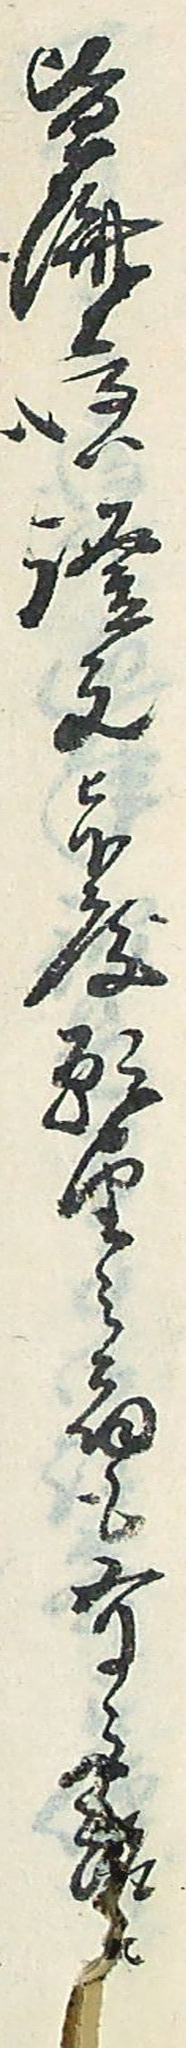皆済候得ハ證文被下度願望之者も有之趣ニ
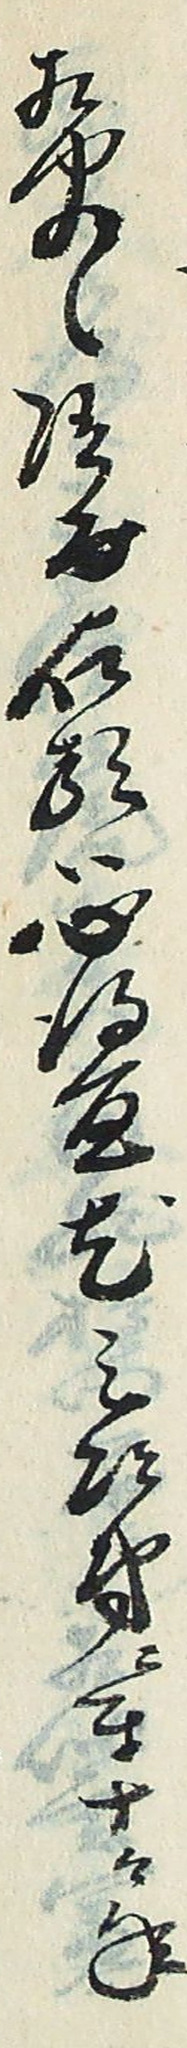相聞候随而右類ハ心得宜尤之次第ニ付十ケ年
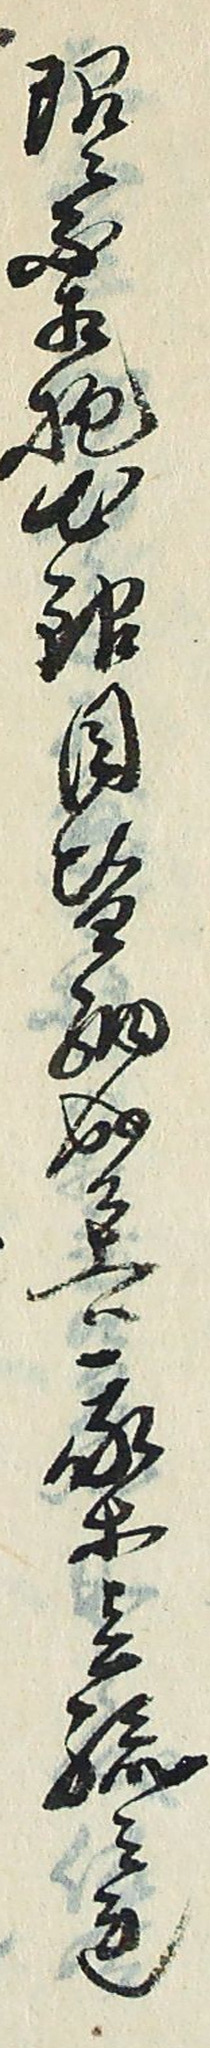限ニ不相抱出銀目皆納成候上ハ家等壱統之連
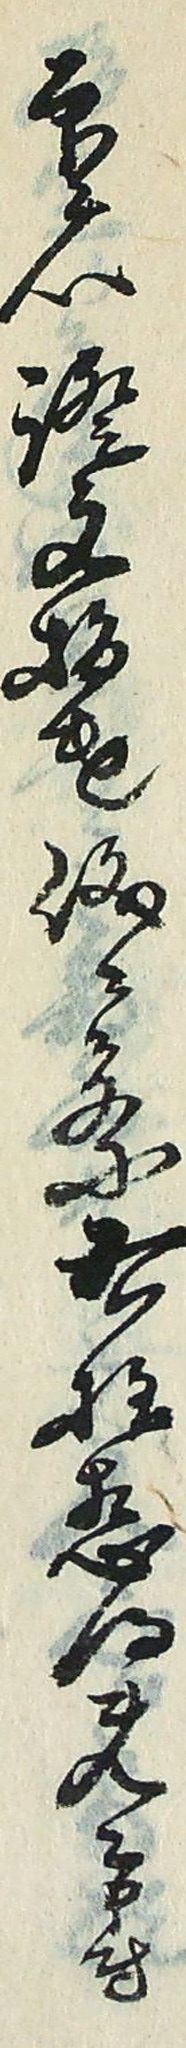印ヲ以證文指遣儀ニ候条右様相心得夫々申付
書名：諸御趣意書并御下知向之写
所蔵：鳴門教育大学 Naruto University of Education
